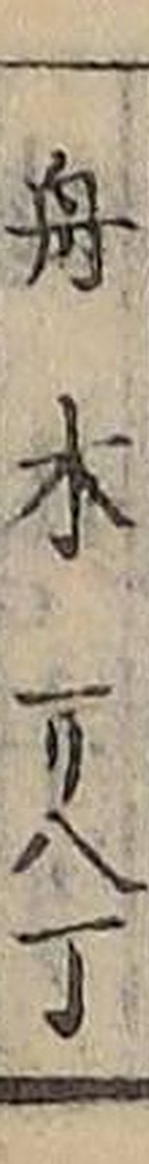舟木一リ八丁
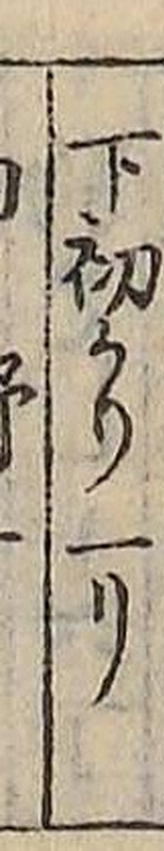下初かり一リ
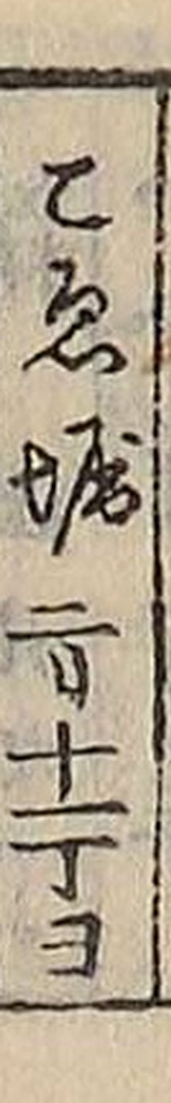こゑ堀二リ十一丁ヨ
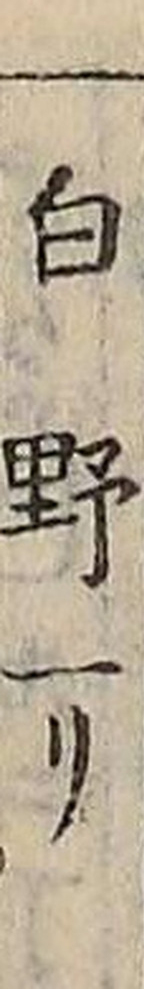白野一リ
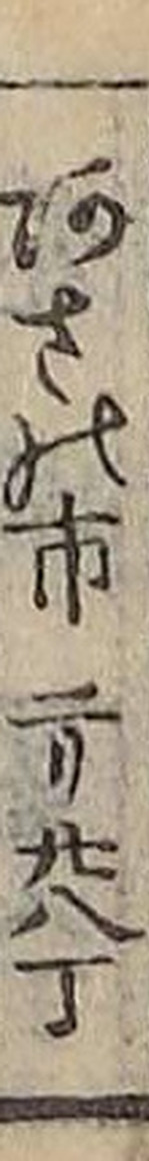あさの市二リ廿八丁
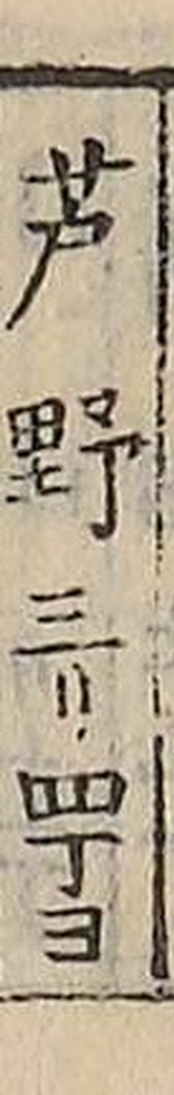芦野三リ四丁ヨ
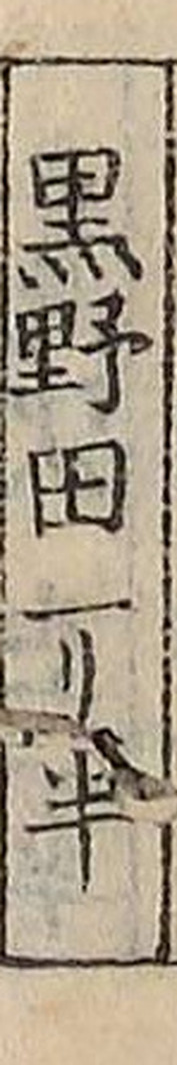黒野田一リ半
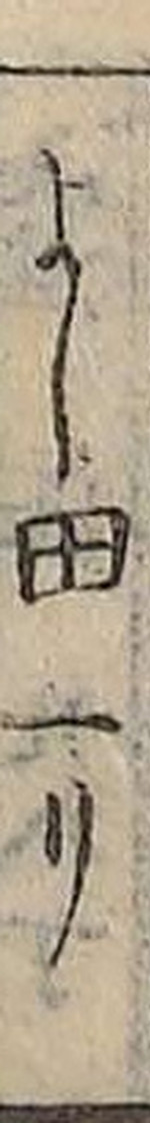よし田一リ
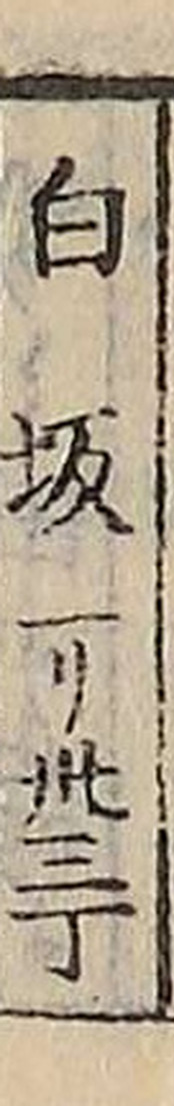白坂一リ卅三丁
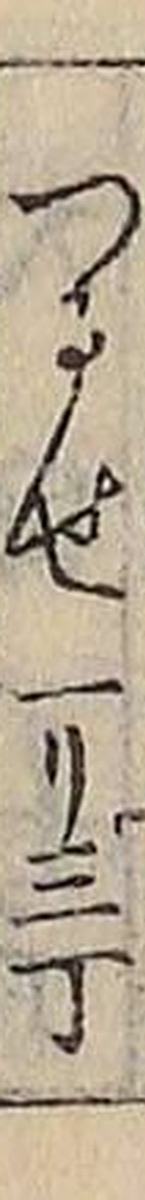つるせ一リ三丁
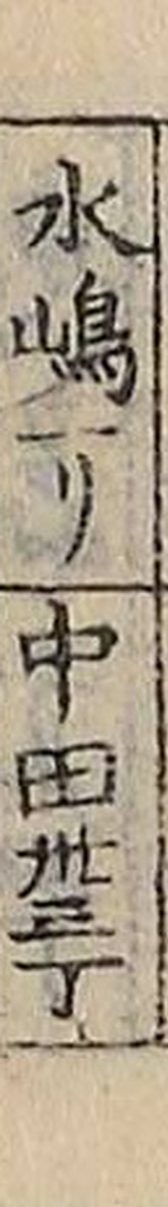水島一リ中田卅三丁
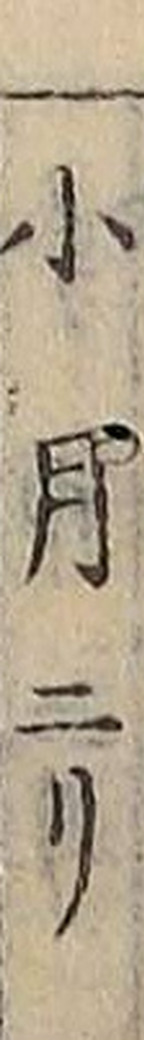小月二リ
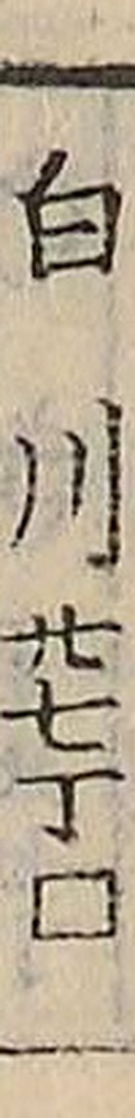白川廿七丁▫
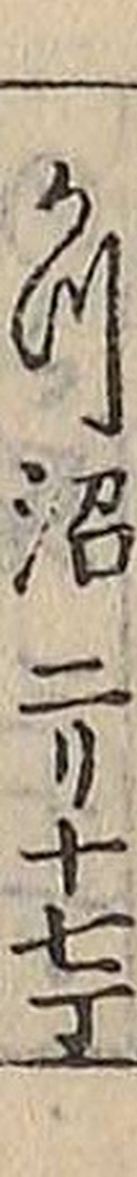かつ沼二リ十七丁
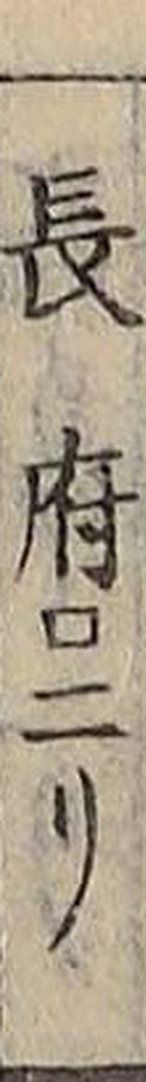長府▫二リ
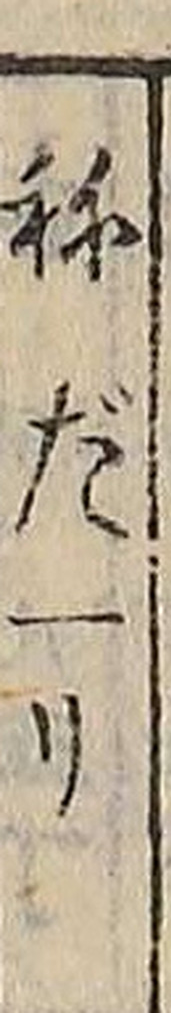ねだ一リ
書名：旅行用心集
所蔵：神戸大学附属図書館 国文学研究資料館
